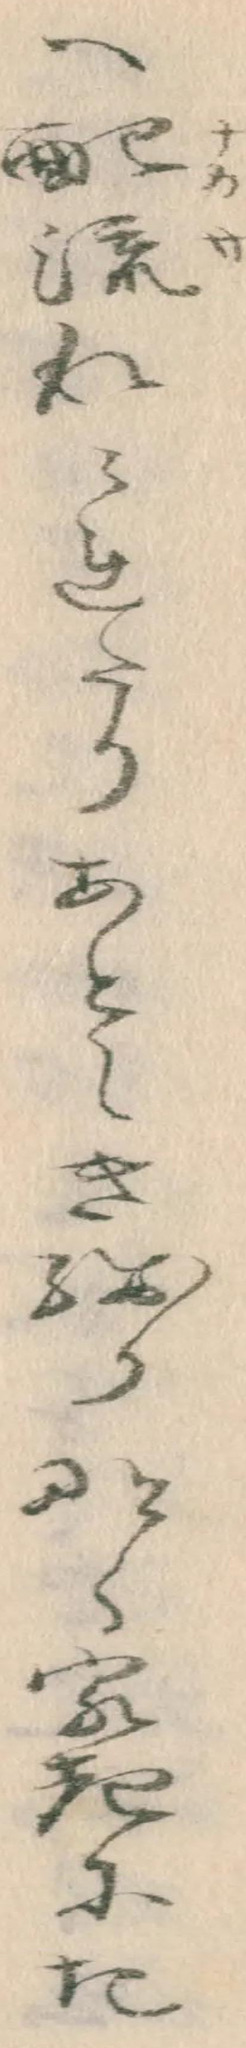へ配流れられたりあとしき残りなく家老にた
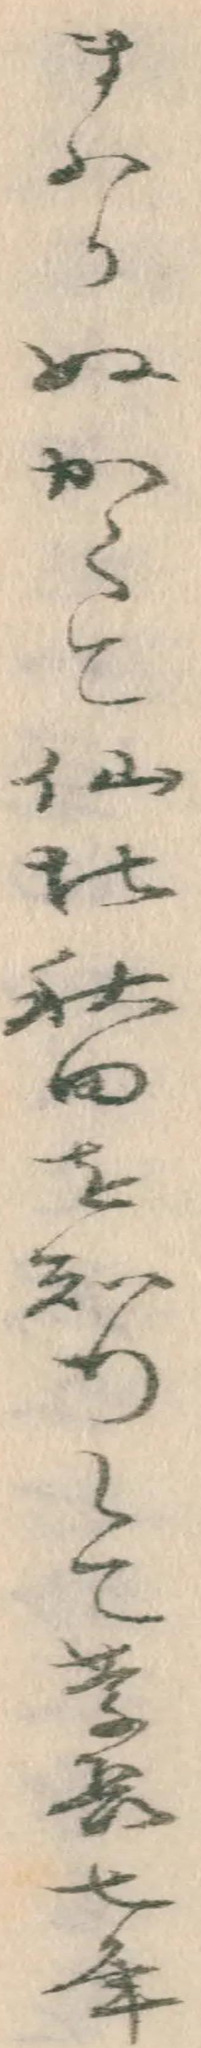まはりぬかくて仙北秋田を知行して慶長七年
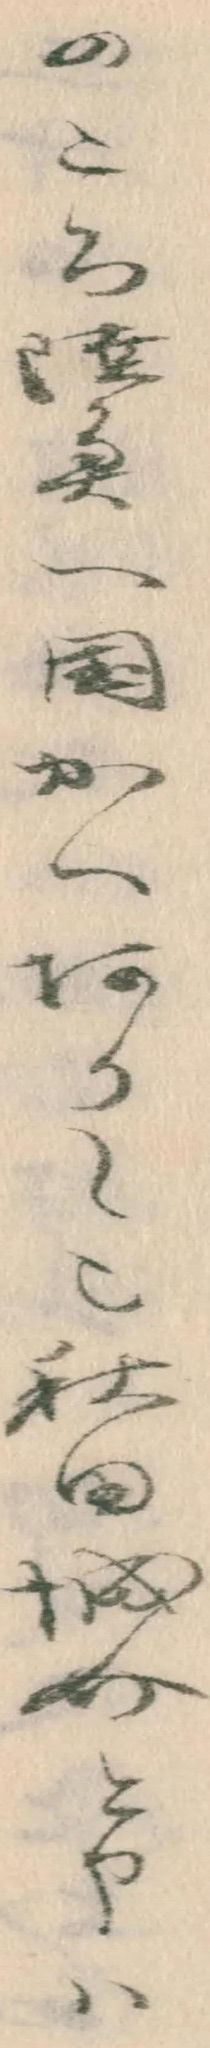のころ陸奥へ国かへありし也秋田城介と申は
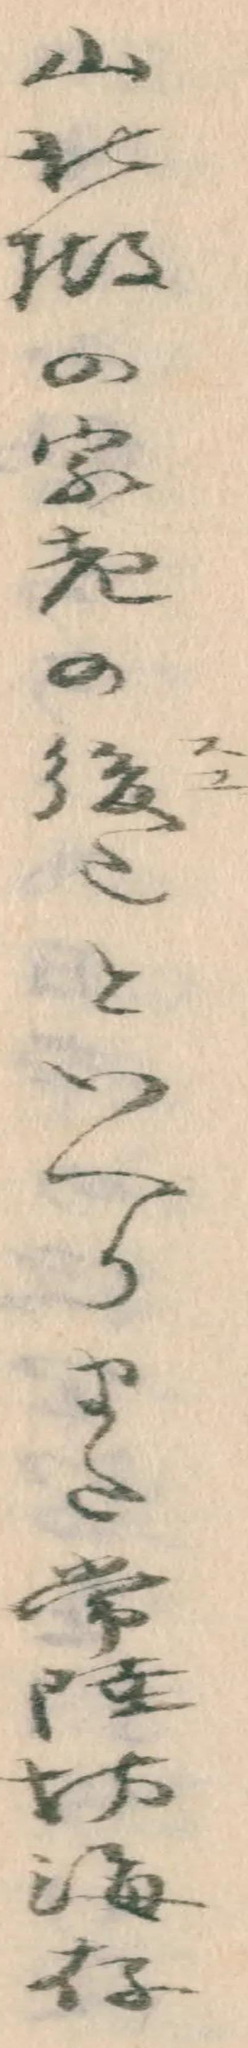山北殿の家老の後也といへりまた常陸坊海存
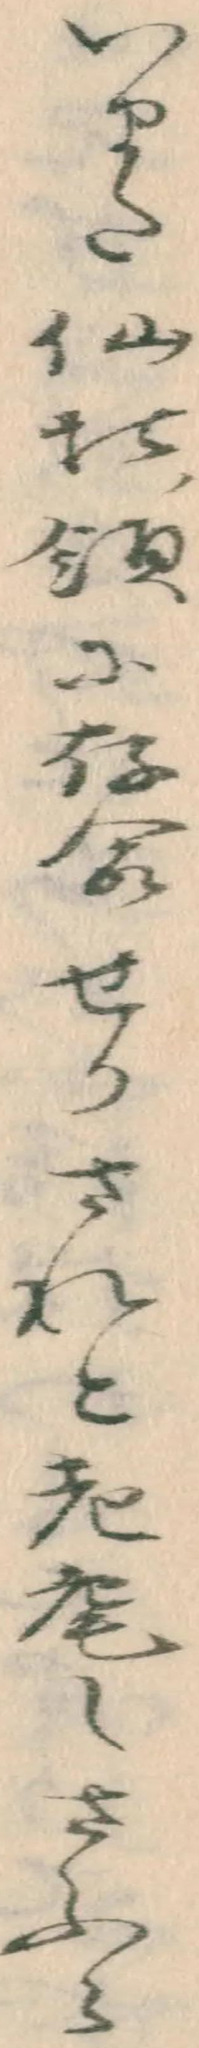いまた仙北領に存命せりされと老耄しさふら
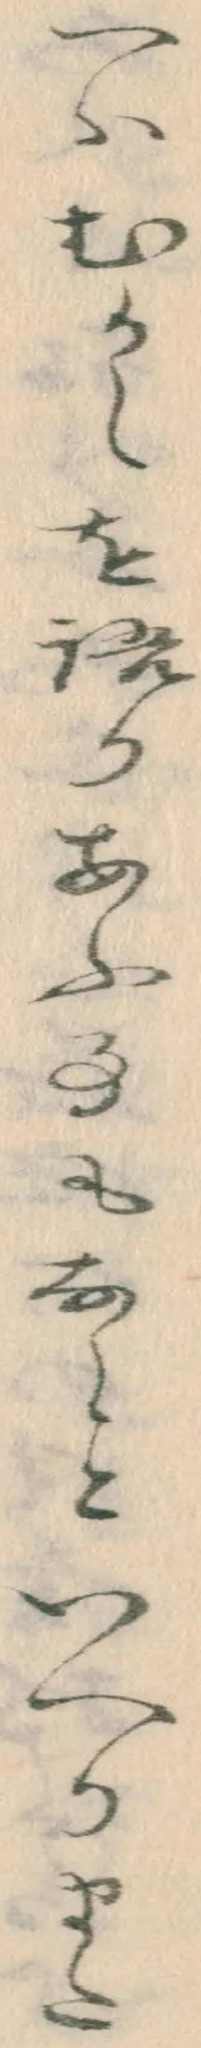ははむかしを語りあふ事もなしといへりまた
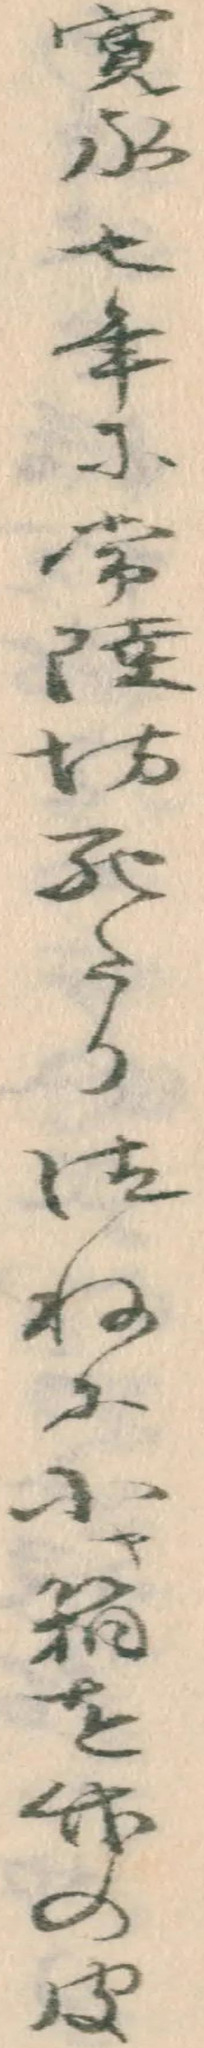寛永七年に常陸坊死たりつねに小箱を竹の皮
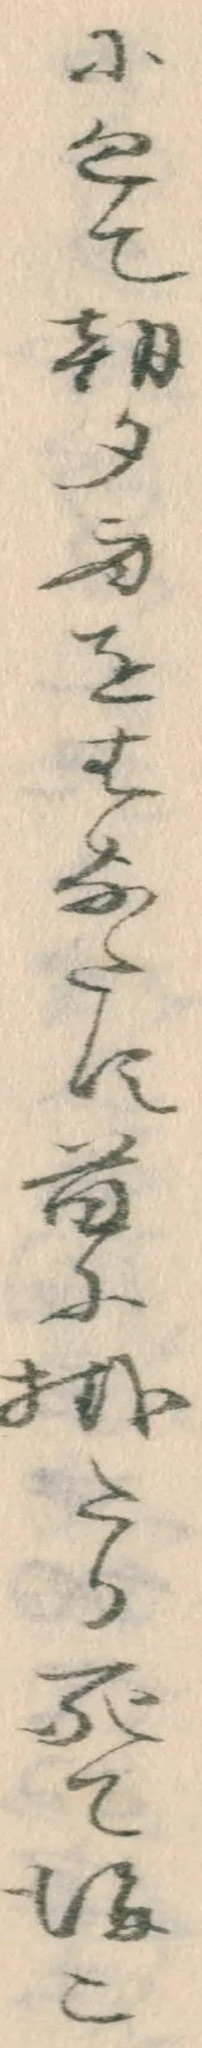に包て朝夕身をはなさす首に掛たり死て後こ
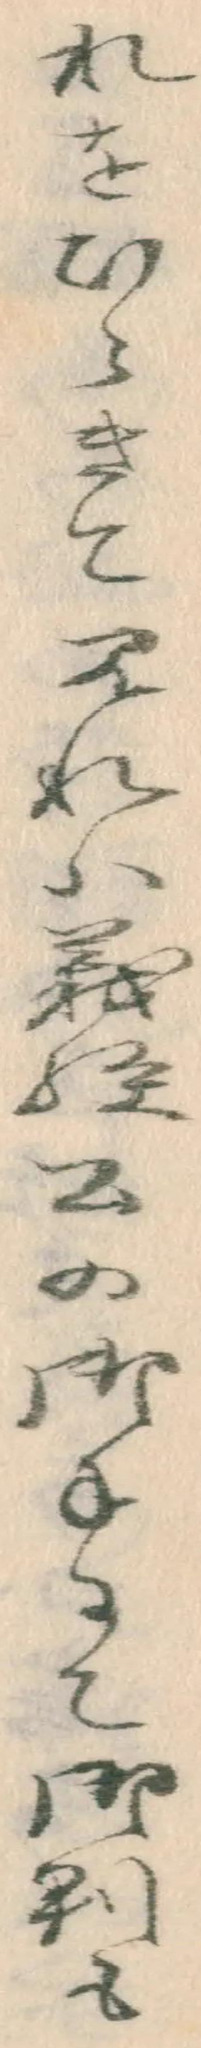れをひらきて見れは義経公の御手にて御判も
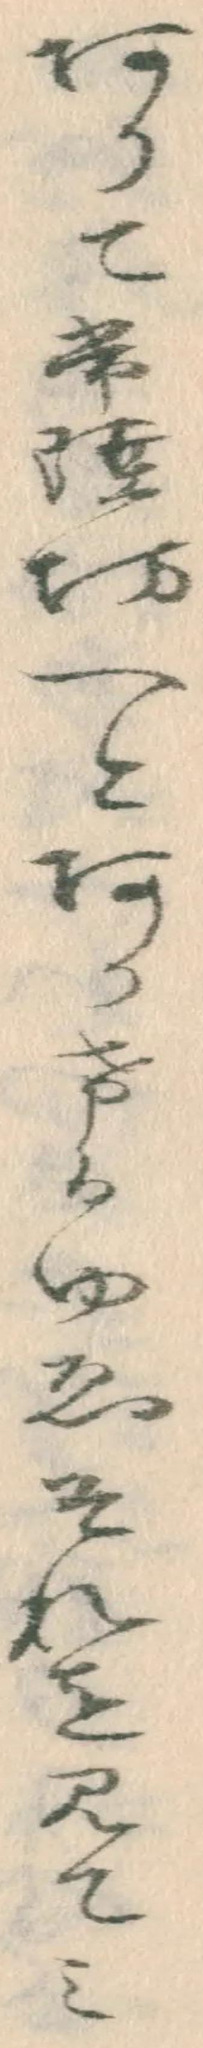ありて常陸坊へとありけるゆゑそれを見てみ
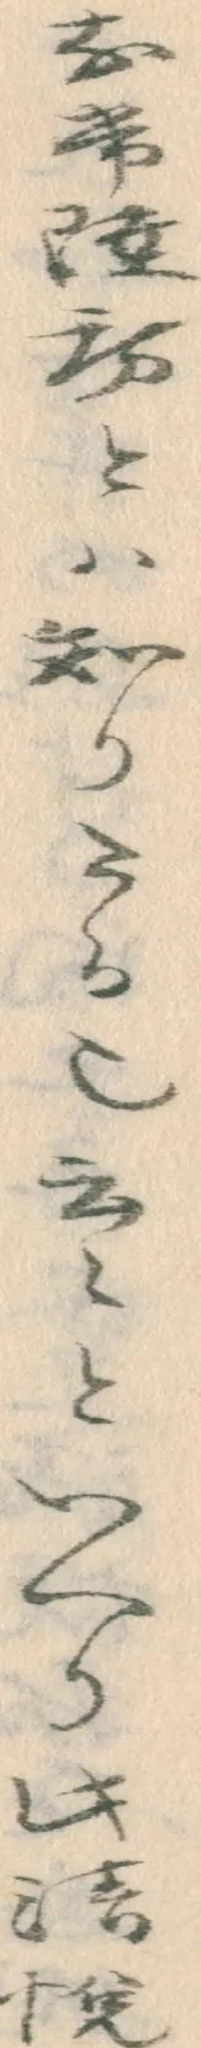な常陸坊とは知りたる也云々といへり此清悅
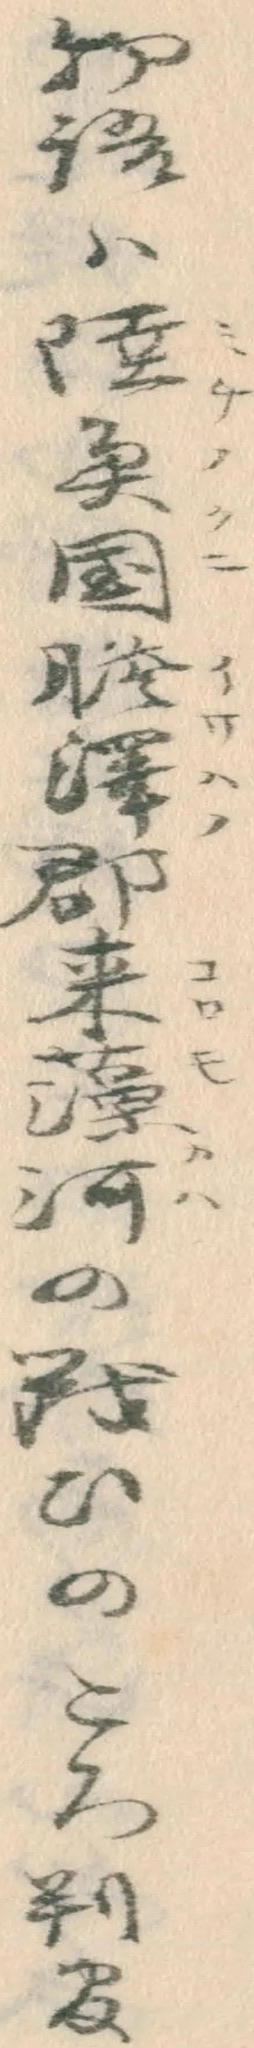物語は陸奥国膽澤郡来藻河の戦ひのころ判官
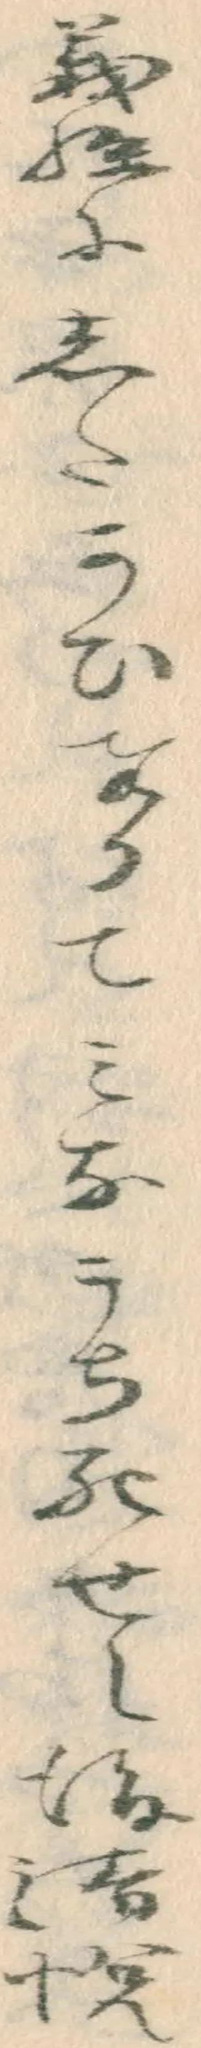義経にしたかひ奉りてみなうち死せし後清悅
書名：眞澄遊覽記[第2冊]
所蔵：国立国会図書館 National Diet Library, JAPAN
